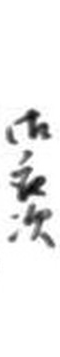御取次
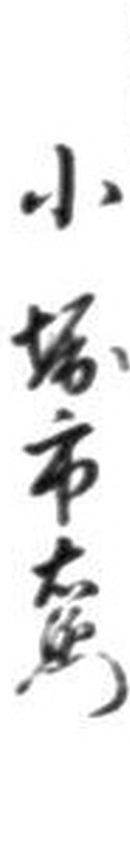小堀市右衛門
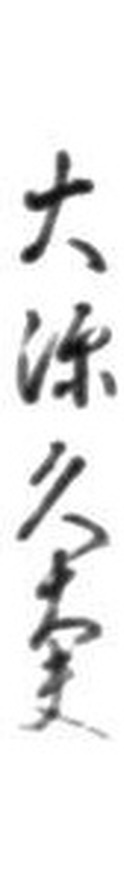大源久大夫
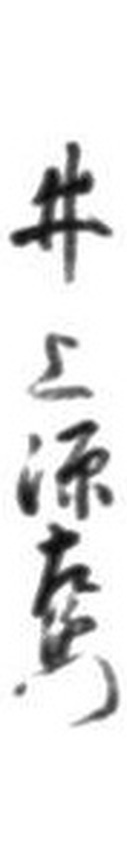井上源左衛門
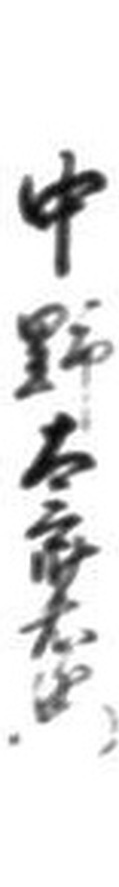中野太郎右衛門
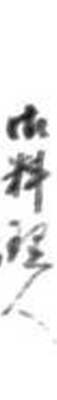御料理人
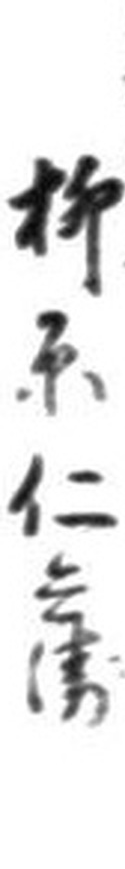柳原仁兵衛
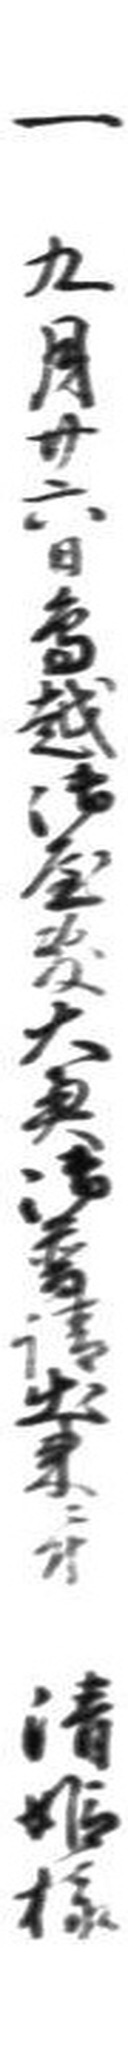一九月廿六日鳥越御屋敷大奥御普請出来ニ付清姫様
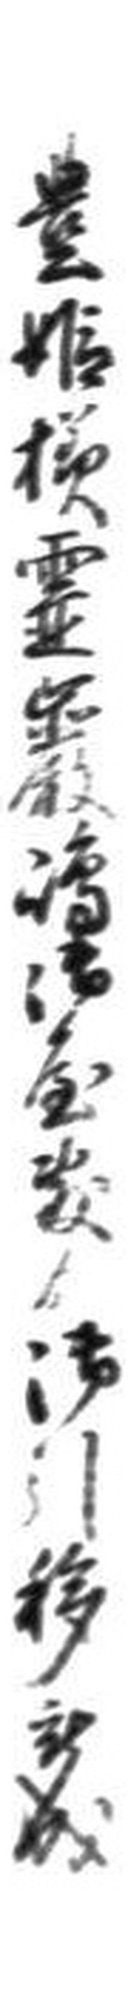豊姫様霊巌嶋御屋敷ゟ御引移被成

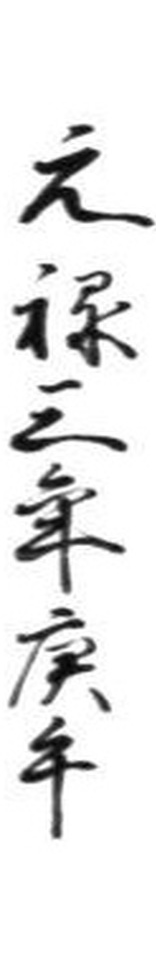元禄三年庚午
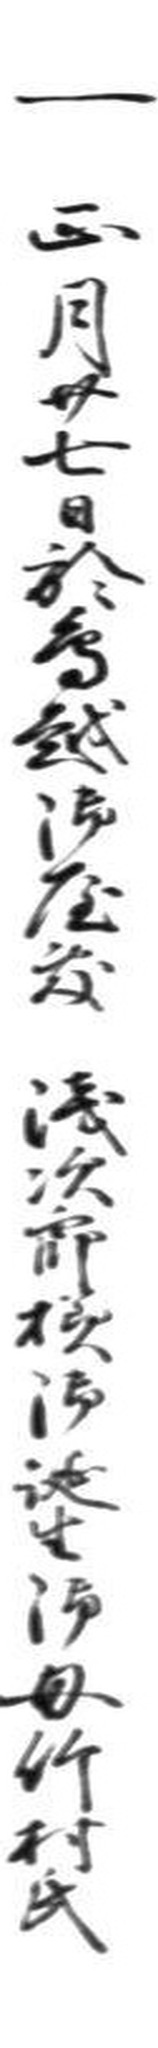一正月廿七日於鳥越御屋敷浅次郎様御誕生御母竹村氏

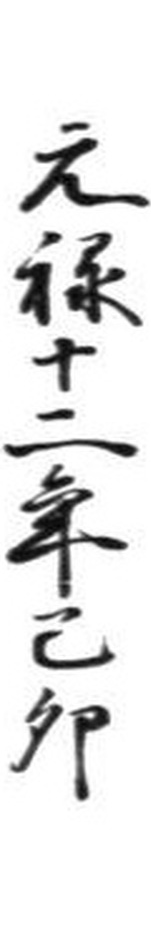元禄十二年己卯
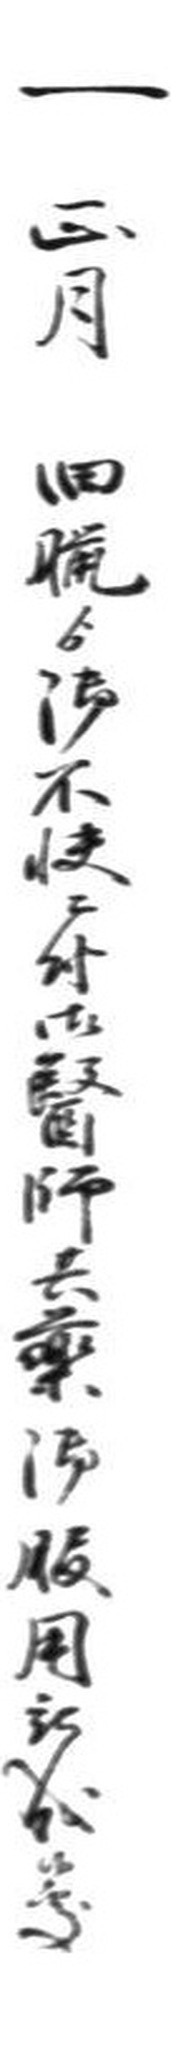一正月旧臘ゟ御不快ニ付御医師共薬御服用被成候処
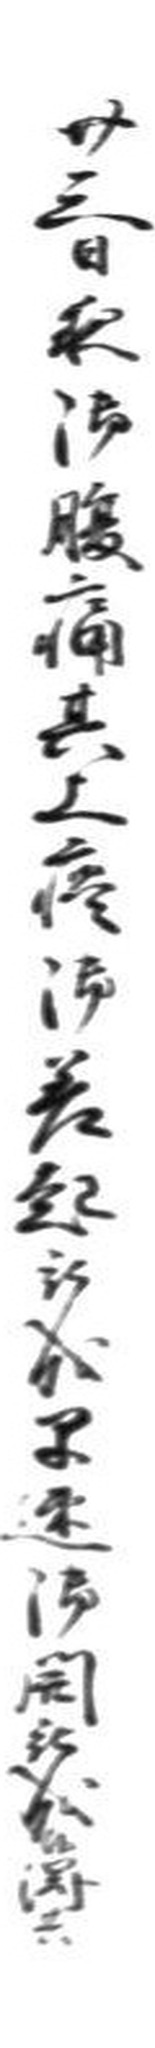廿三日夜御腹痛其上疼御差起被成早速御開被成候得共
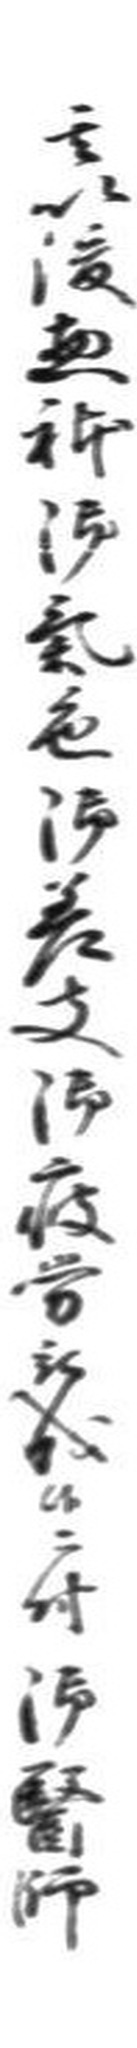其以後惣躰御気色御差支御疲労被成候ニ付御医師
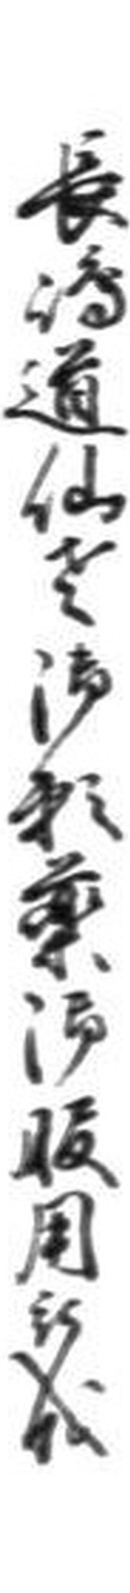長嶋道仙老御頼薬御服用被成
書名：家譜 十五 綱昌公 従天和元年到元禄十二年
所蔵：福井県文書館 Fukui Prefectural Archives
